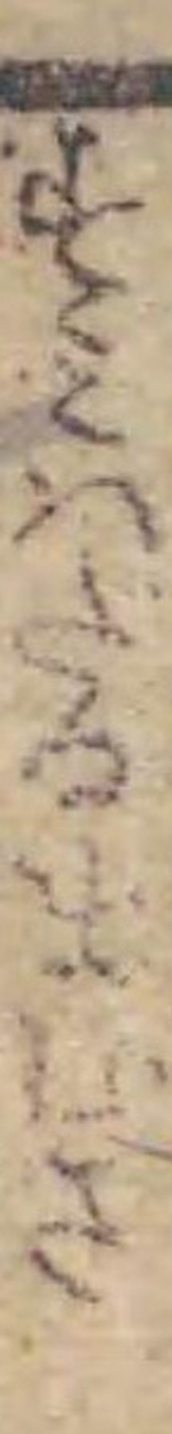すみはだるまむさ
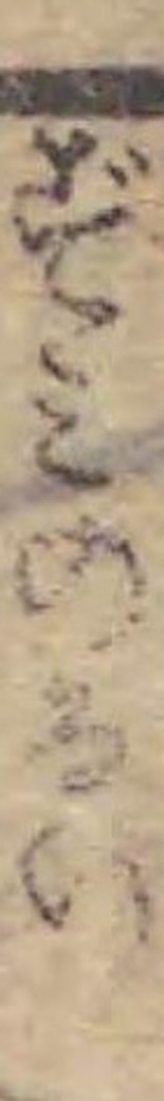ずみのるい
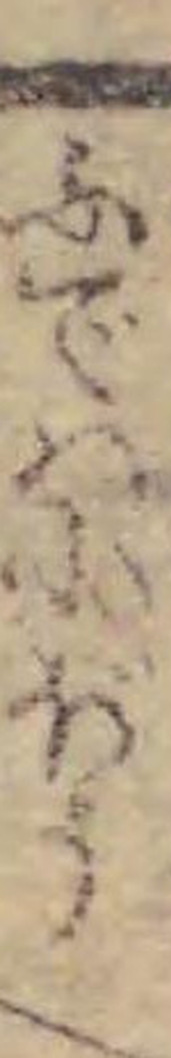ふでは小ぼう
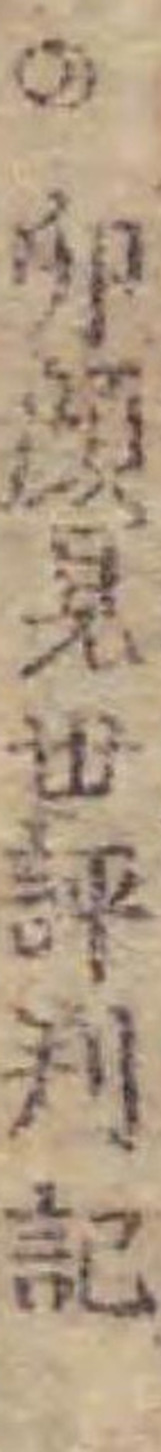卯顔見世評判記
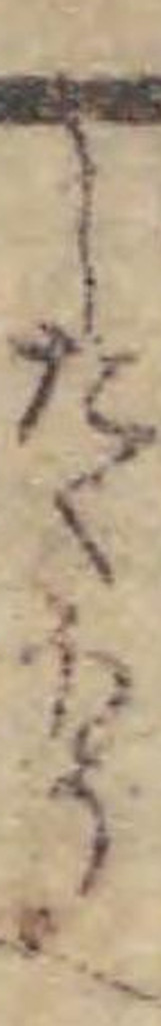したくほう
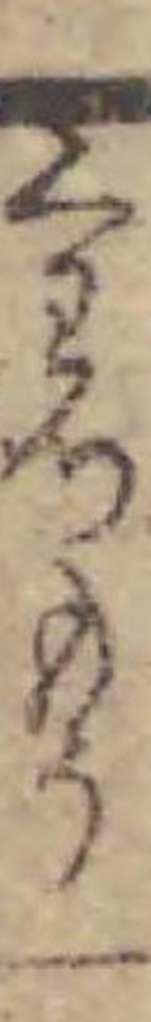くわつもう
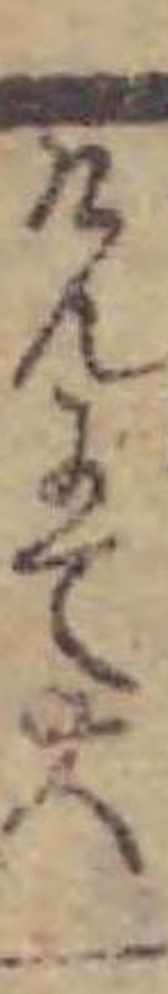けんにて大
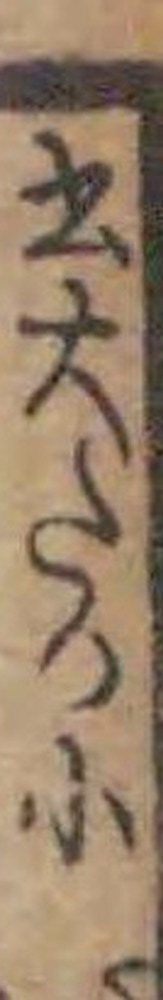書大たか小
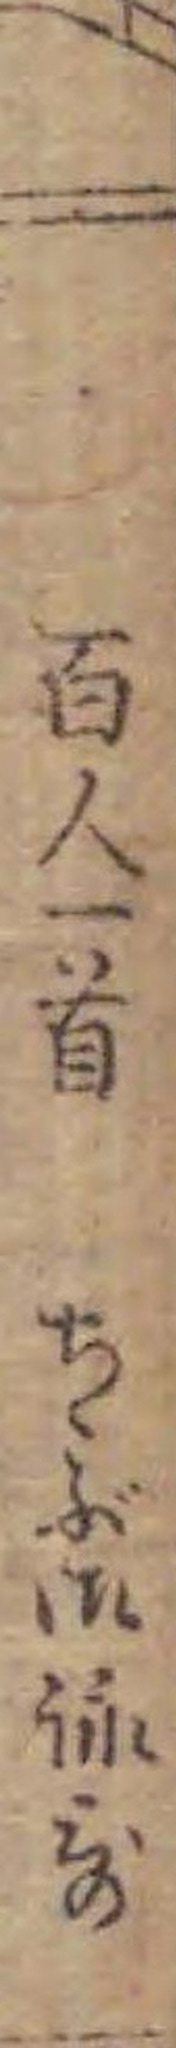百人一首ちゝぶ流詠哥
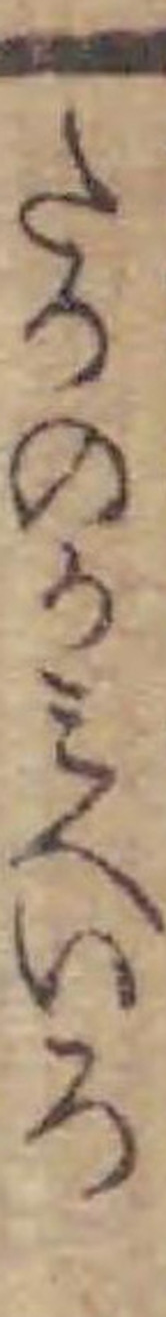たかのかみへいろ
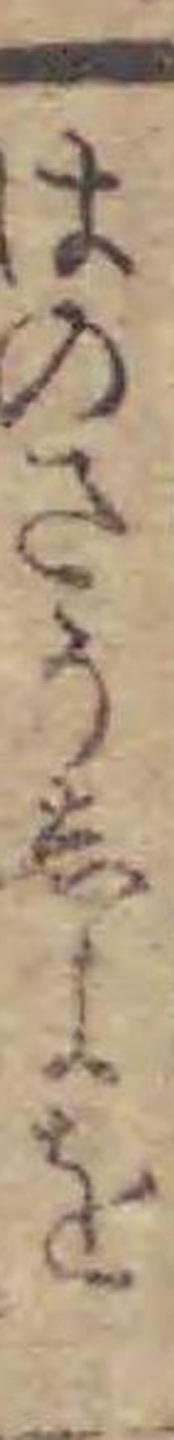はのさうしよを
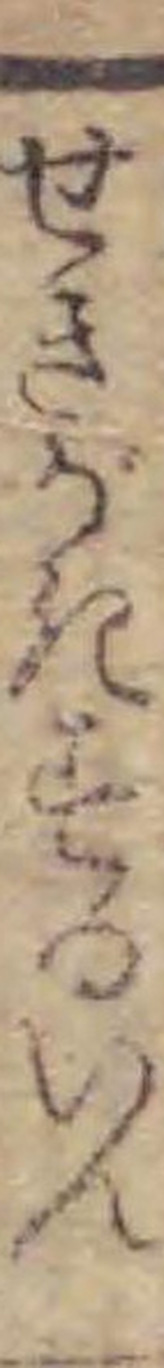せきがきするいん
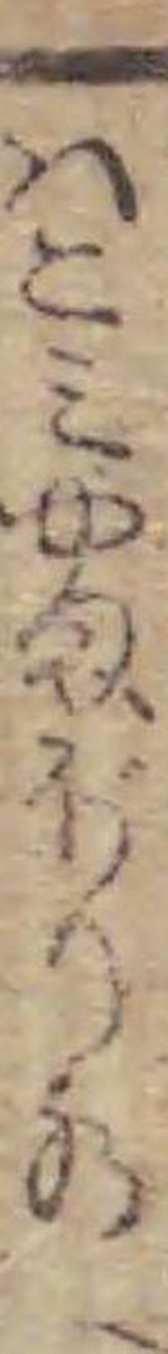はこみやまぼり水
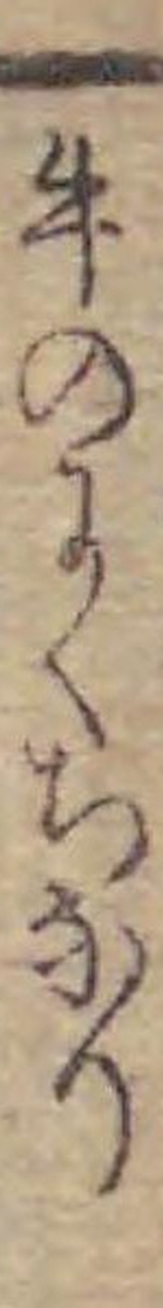牛のよくちなり
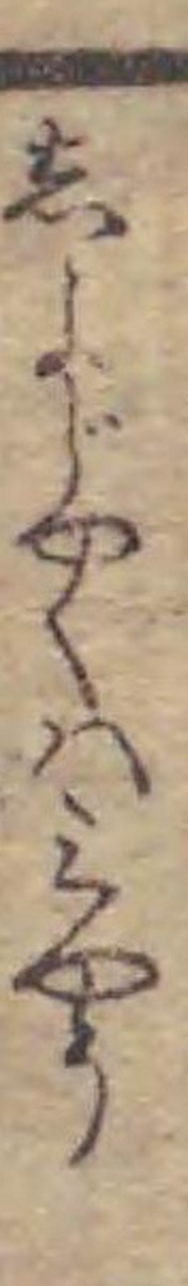しよじやくはみやう
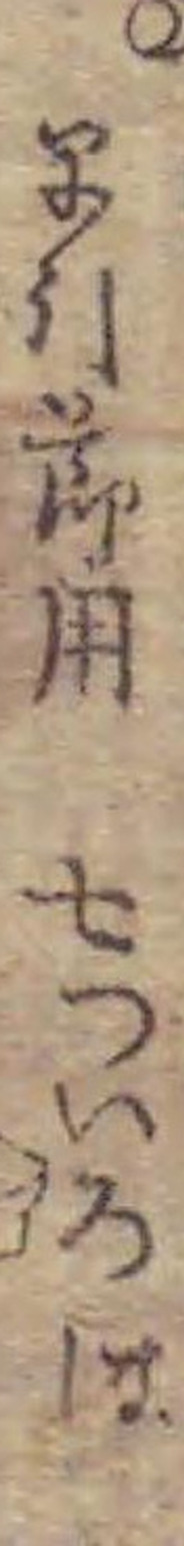早引節用七ついろは
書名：此奴和日本 : 2巻
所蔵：国立国会図書館 National Diet Library, JAPAN
